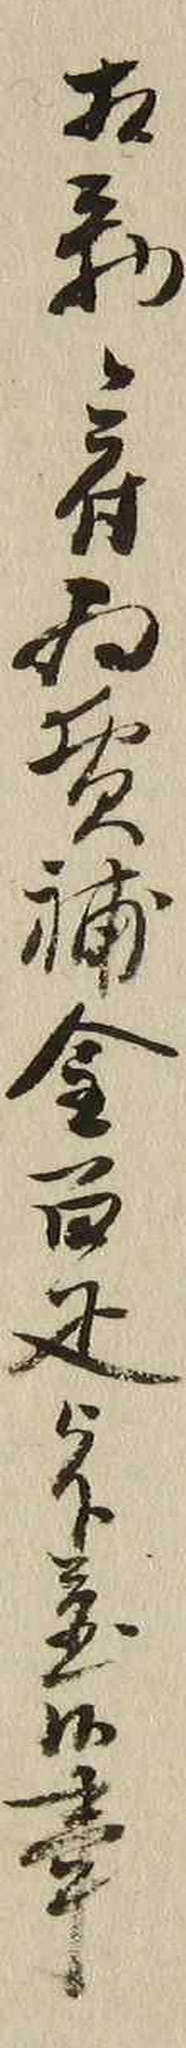相勤候ニ付為費補金百疋被下置候事
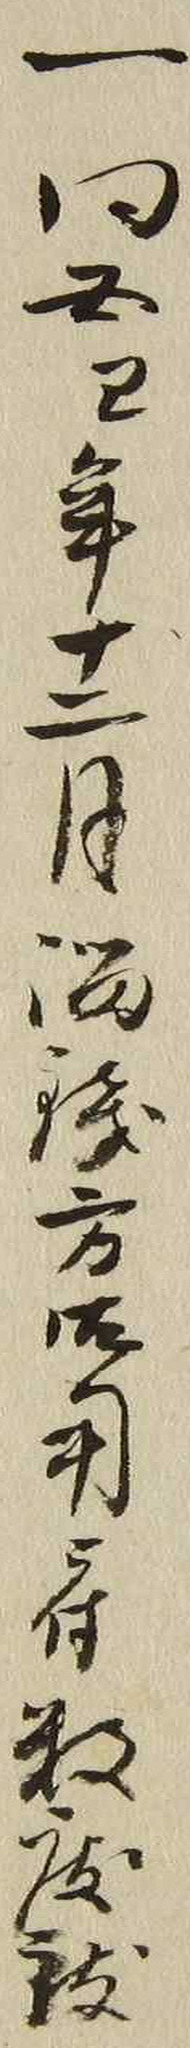一同五巳年十二月溜銭方御用ニ付数度致
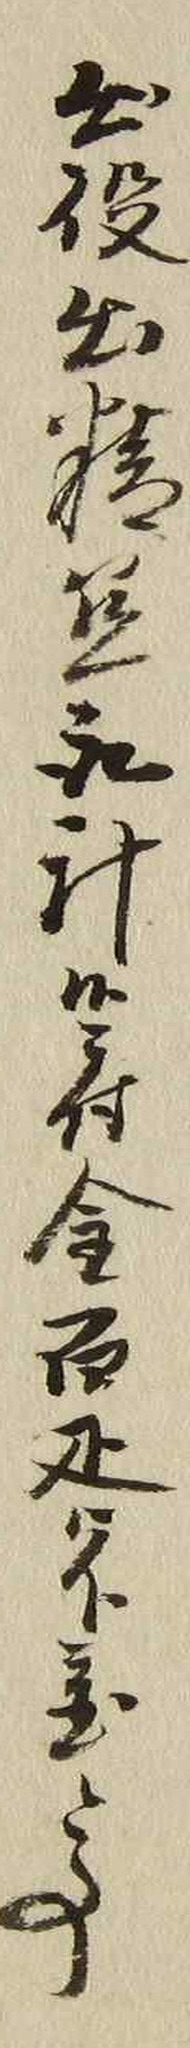出役出精宜取計候ニ付金百疋被下置候事
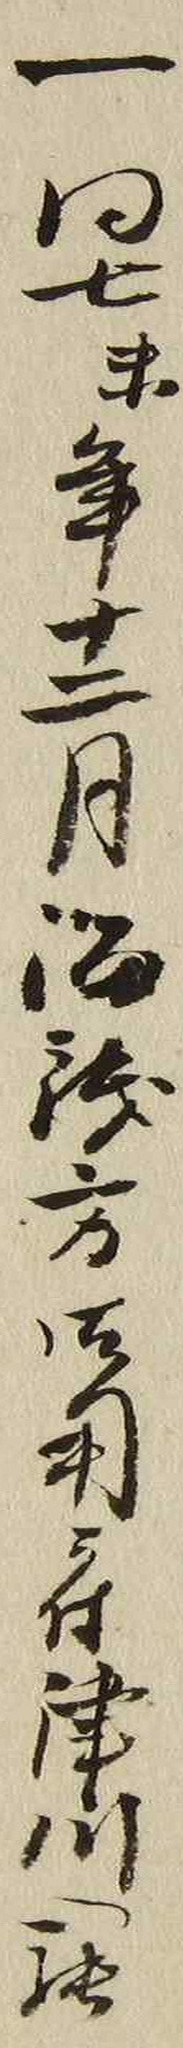一同七未年十二月溜銭方御用ニ付津川へ罷
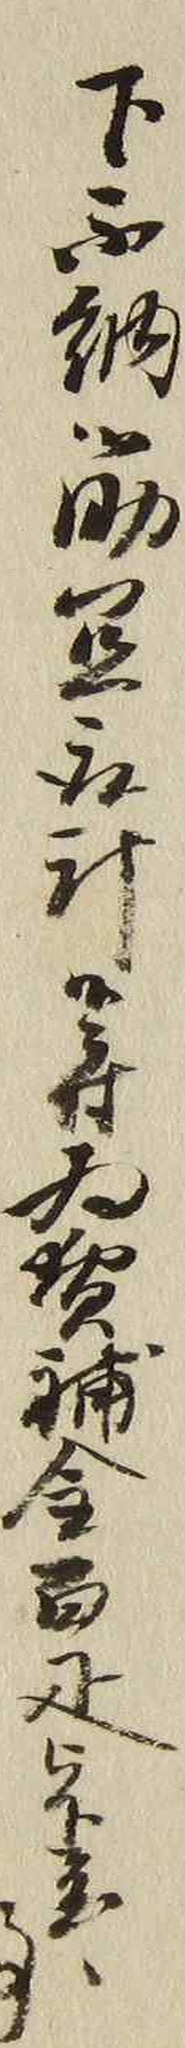下不納筋宜取計候ニ付為費補金百疋被下置候事
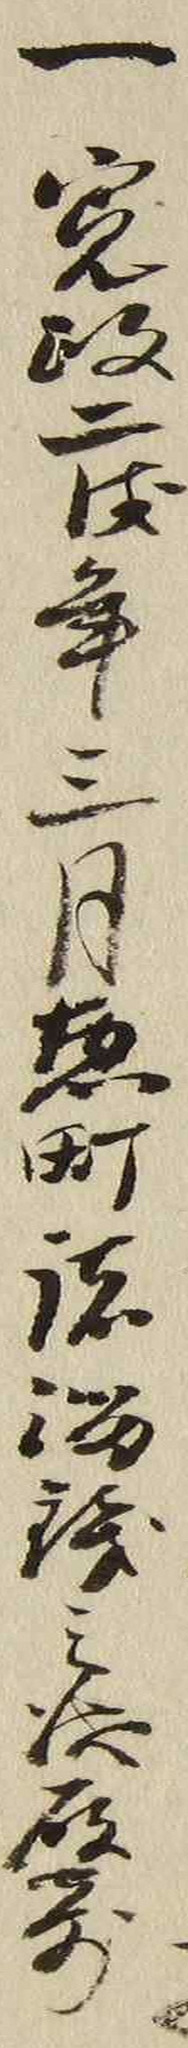一寛政二戌年三月惣町諸溜銭之儀存寄
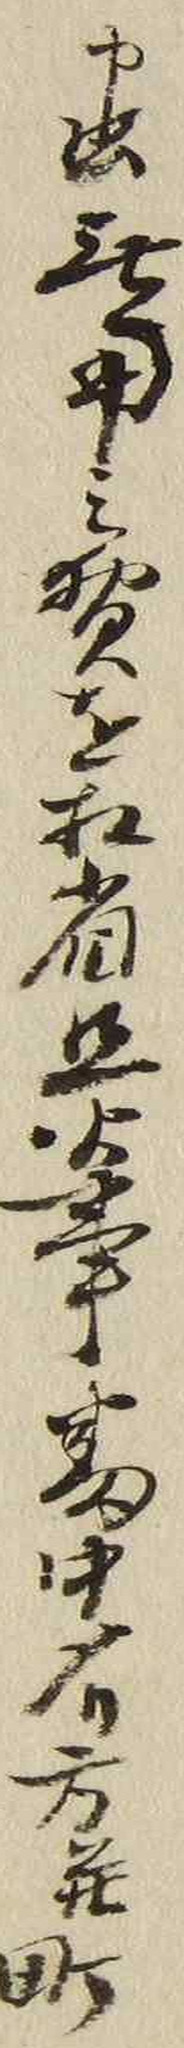申出無用之費を相省且火事番中〆り并町
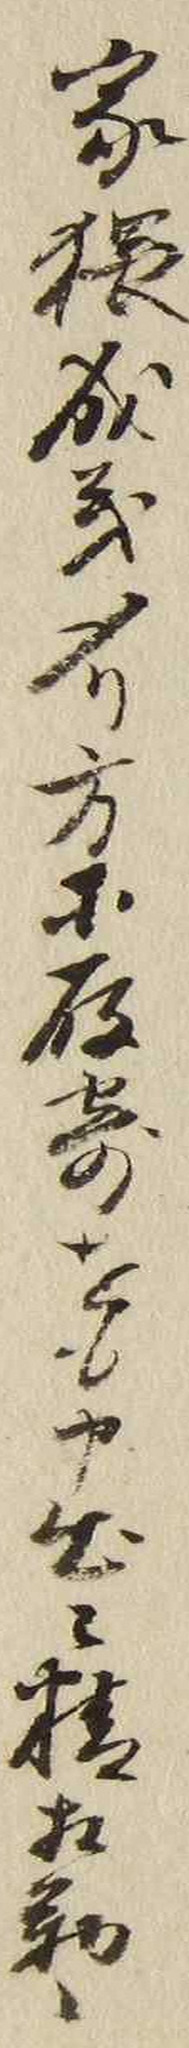家猥成義〆り方等存寄をも申出々精相勤候

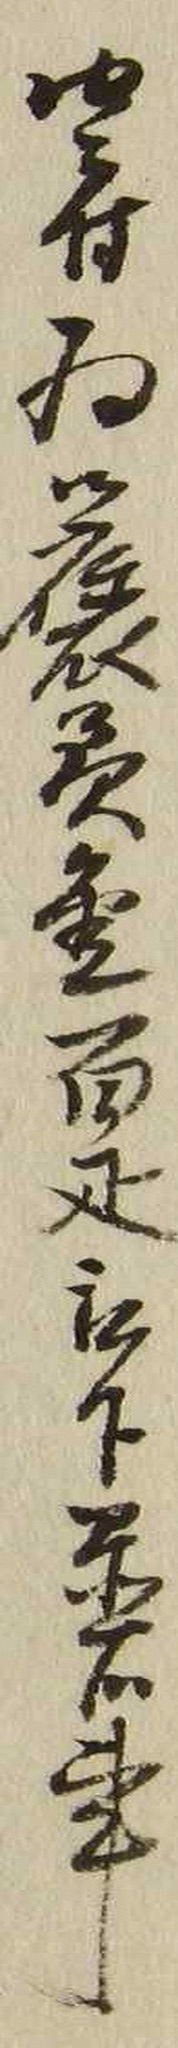由ニ付為御褒美金百疋被下置候事
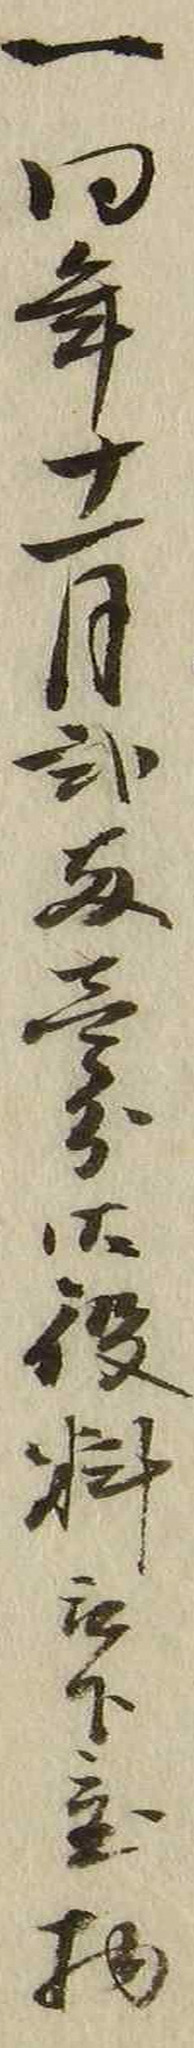一同年十一月弐両壱分御役料被下置物
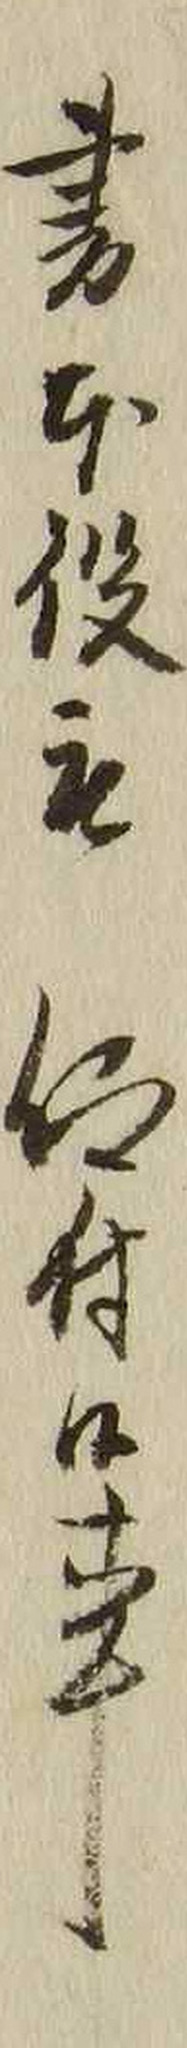書本役被仰付候事
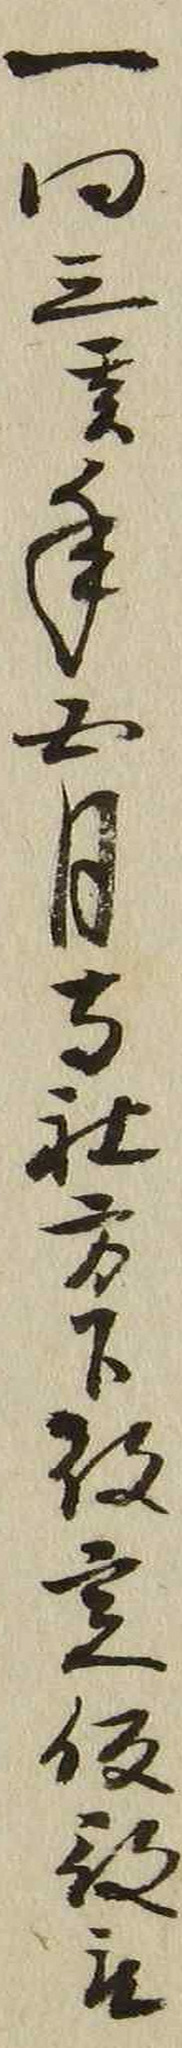一同三亥年五月寺社方下役定仮役被
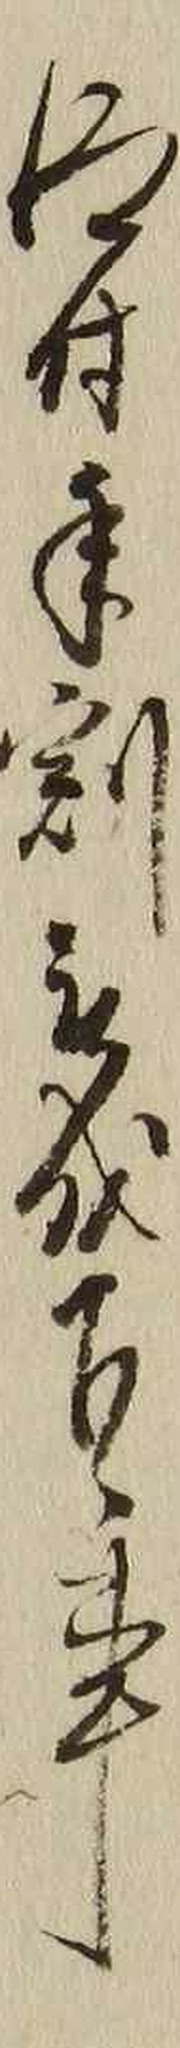仰付年割被成下候事
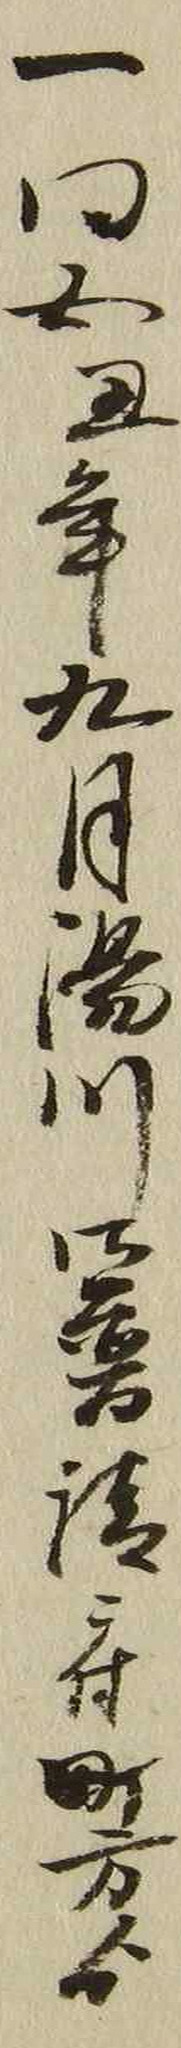一同五丑年九月湯川御普請ニ付町方ゟ
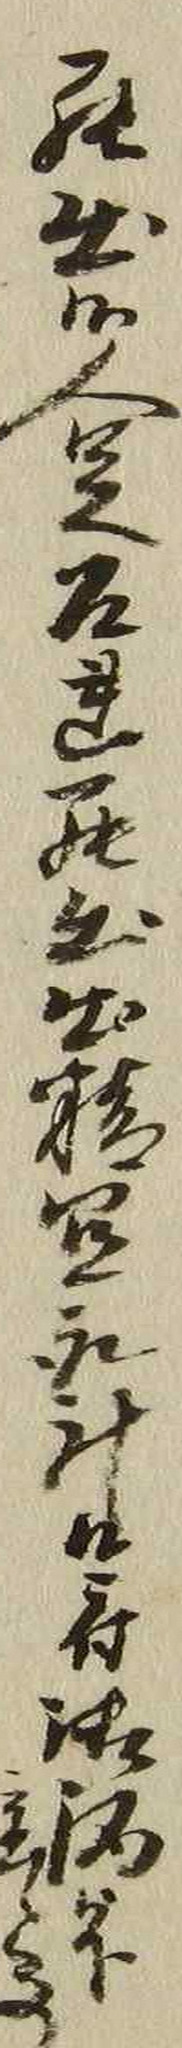罷出候人足召連罷出出精宜取計候ニ付御酒被下置候事
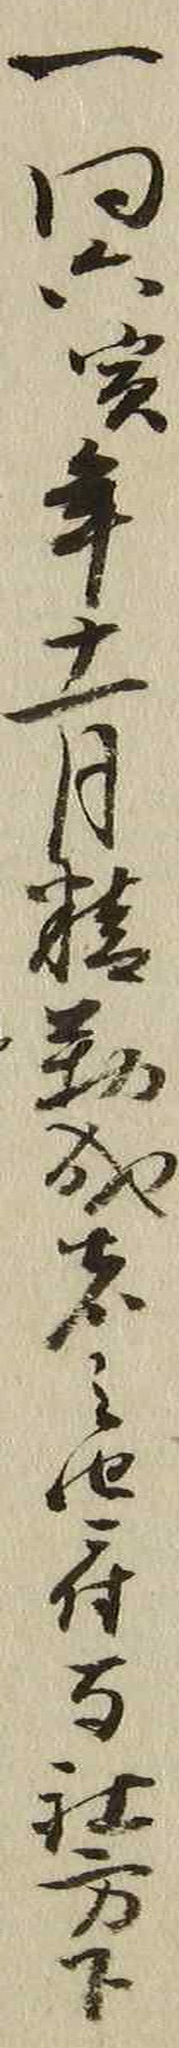一同六寅年十一月精勤成者之由ニ付寺社方下
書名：諸士系譜　巻之360　す之部10
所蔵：会津若松市立会津図書館
